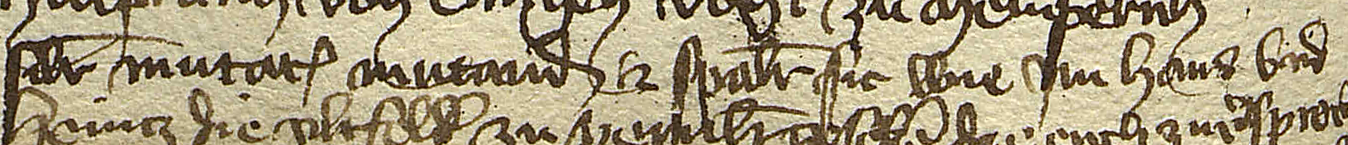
ſilr* mutat* mutand* @ ſpalr* ſic wie Im hans vnd
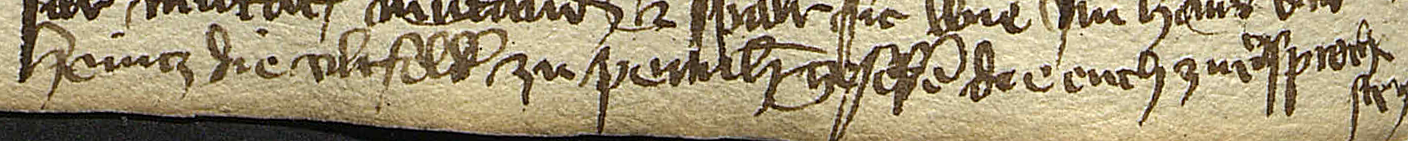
heincʒ die vltfeld* cʒu pernh* geſeſʒe* die euch cʒuv*ſpreche*
